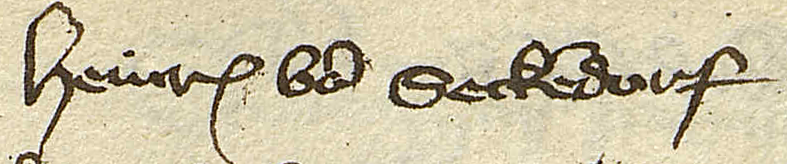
heinr* vo* Secke*dorf
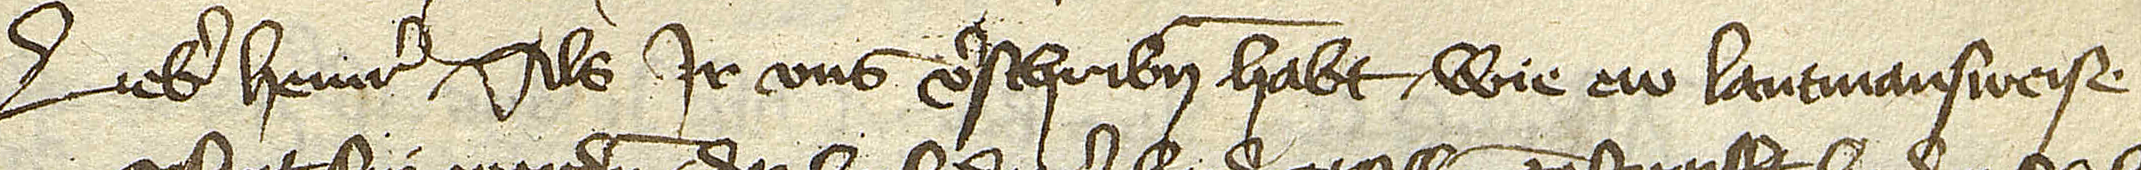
Lieb* heinr* / Als Ir vns v*ſchribn* habt / wie ew lantmanſweiſe
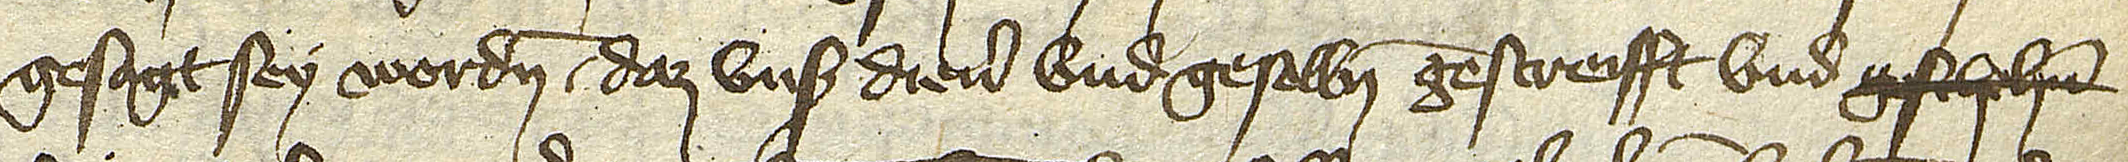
geſagt ſey wordn* / daʒ vnſ* dien* geſelln* geſtreifft vnd geſchehn*
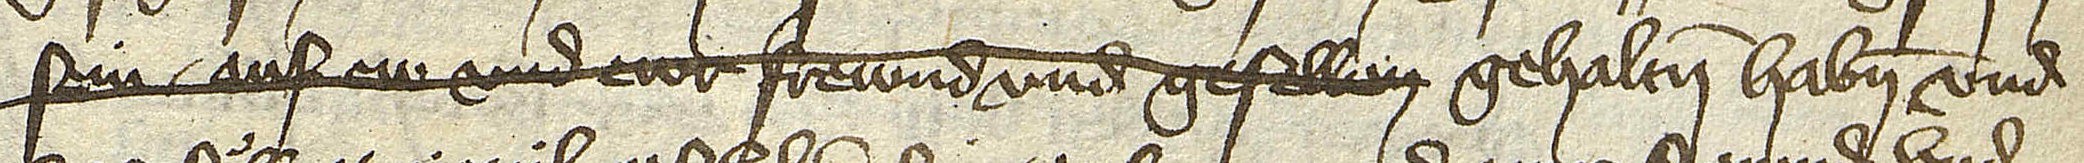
ſein / auf ew vnd ewr frewnd vnd geſellen gehaltn* habn* vnd
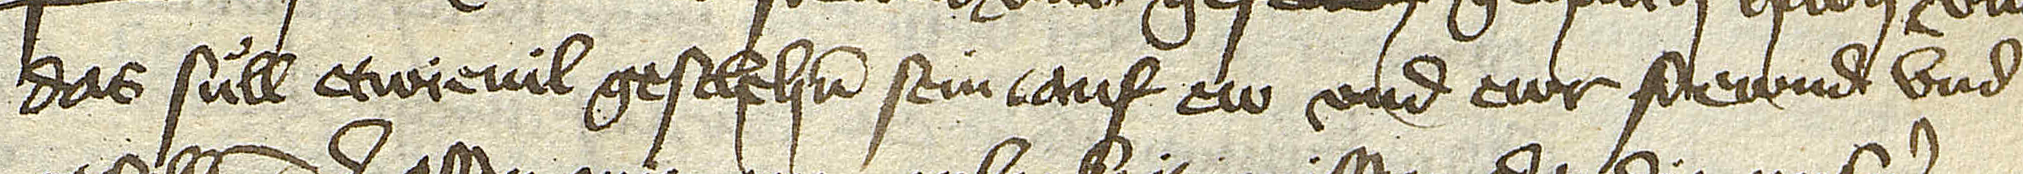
das ſüll etwieuil geſchehn* ſein / auf ew vnd ewr* frewnd vnd
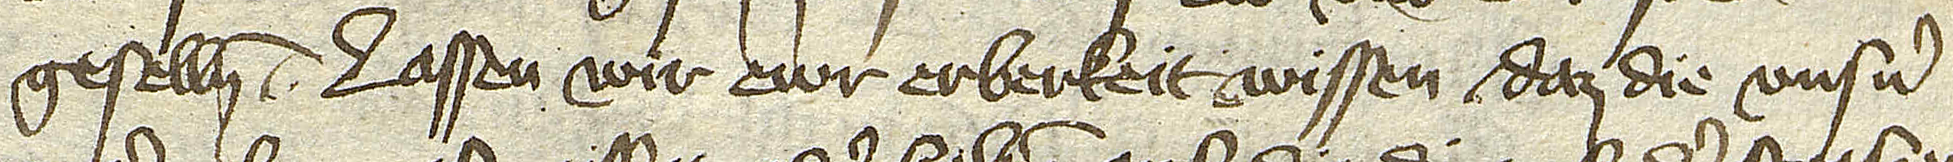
geſelln* /. Laſſen wie ewr erberkeit wiſſen / daʒ die vnſn*
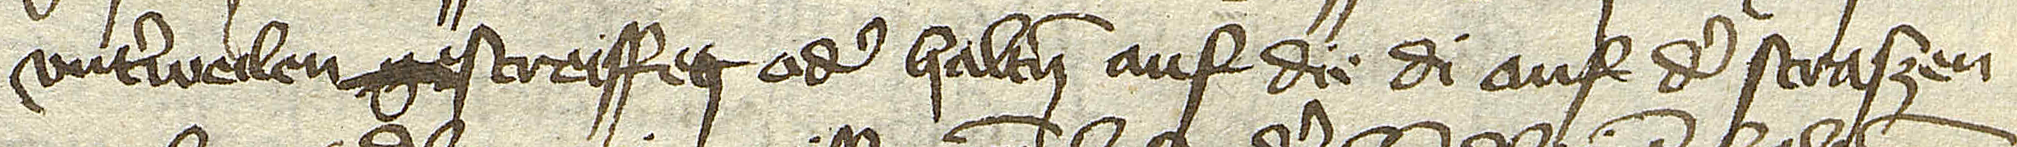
vnt*weilen geſtreiffen od* haltn* auf die di auf d* ſtraſʒen
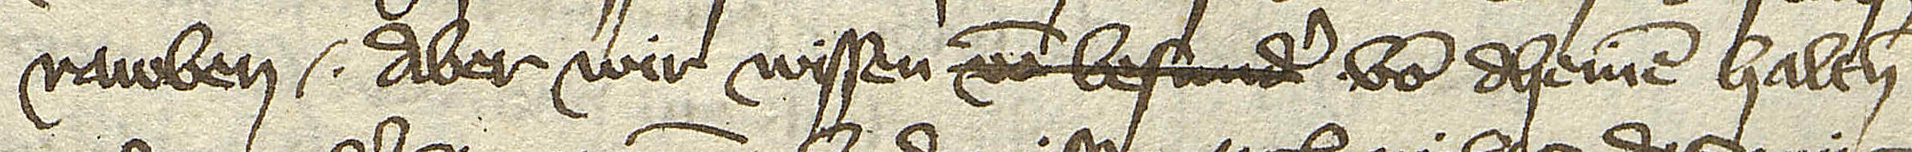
rawben / . Aber wir wiſſen vo* beſund* vo* dheine* haltn*
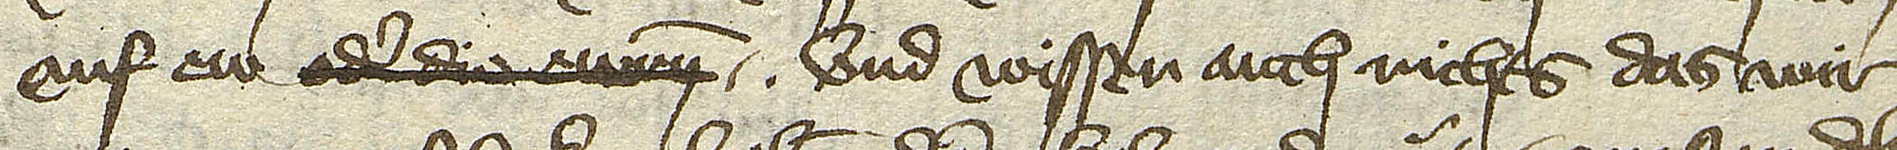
auf ew od* die ewrn* / . vnd wiſſen auch nichts das wir
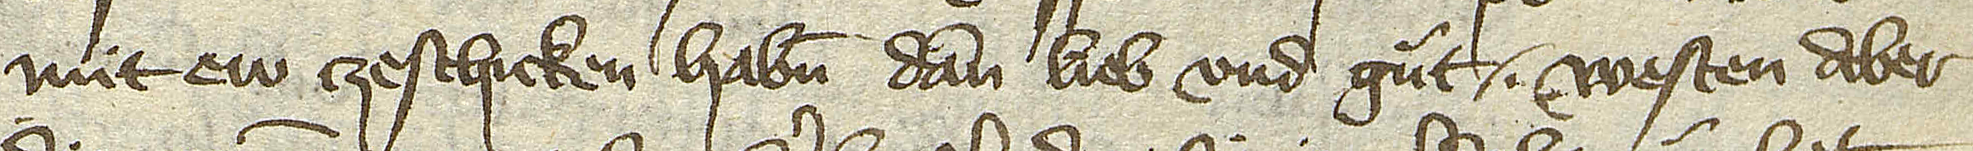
mit ew cʒeſchicken habn* dan* lieb vnd güt / . weſten Aber
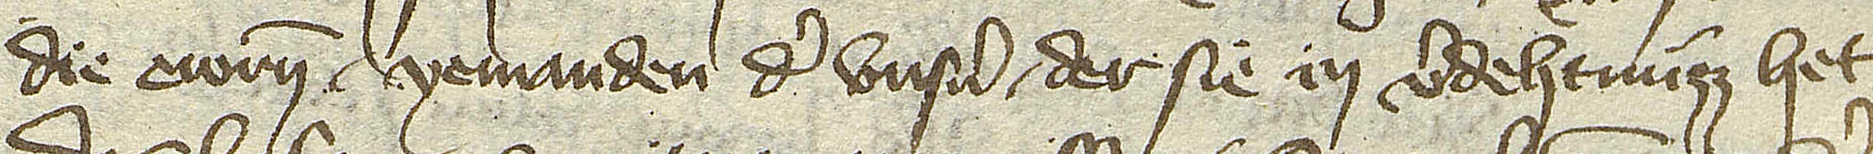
die ewrn* / yemanden d* vnſn* / der ſie in v*dehtnüʒʒ het
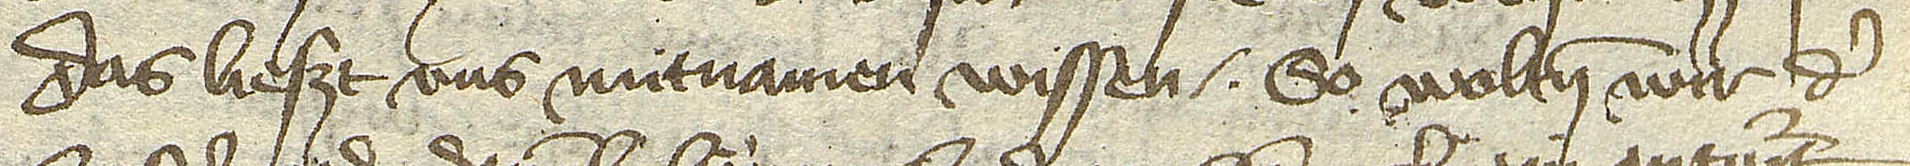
Das lieſʒt vns mitnamen wiſſen / . So woltn* wir d*
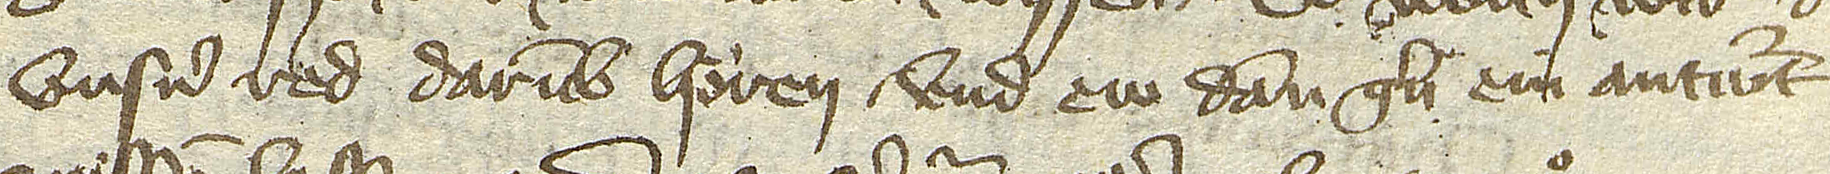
vnſn* red darub* hören / vnd ew dan* g*n ein antwt*
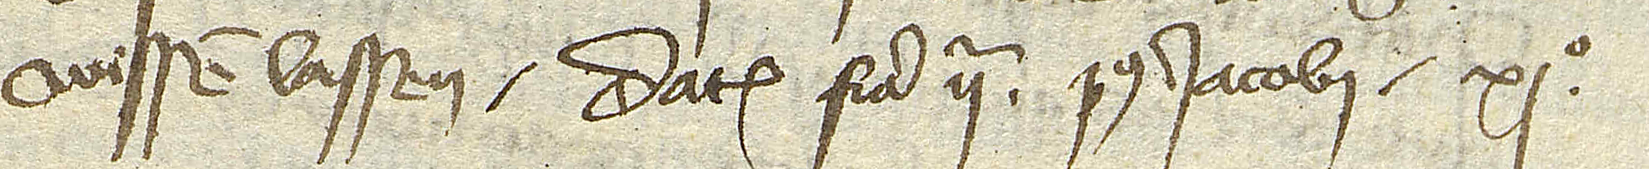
wiſſe* laſſen / Dat* fia* ii*. p* Iacobi / xi*.
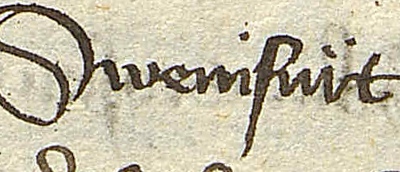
Sweinfürt
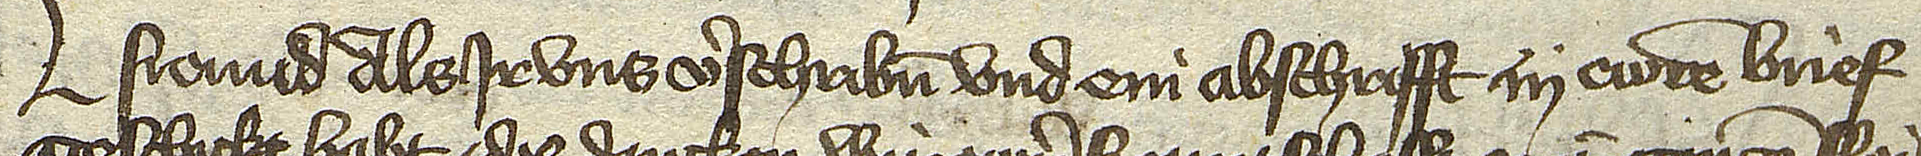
L* freund Als Ir vns v*ſchribn* vnd ein abſchrifft in ewre* brief
